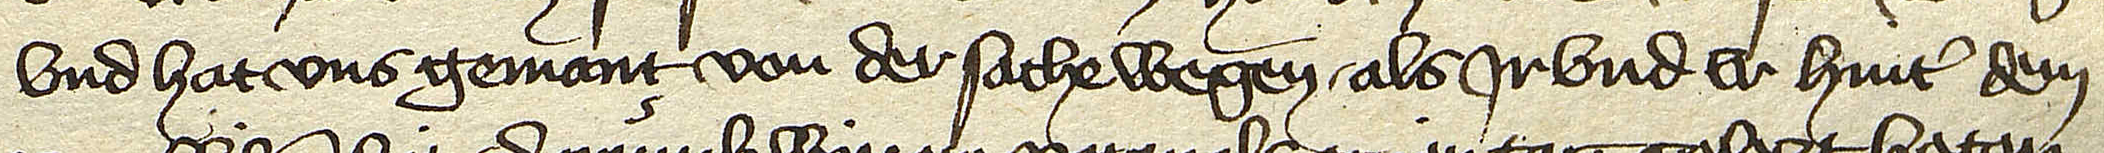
vnd hat vns gemant von der ſache wegen / als Ir vnd Er hint* dem
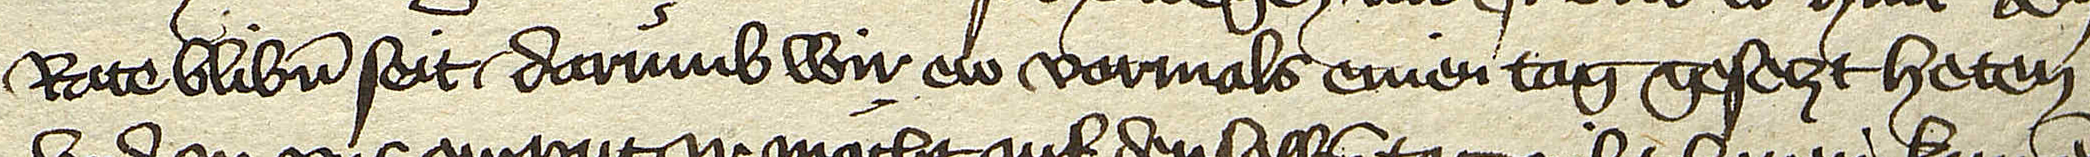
Rate blibn* ſeit / darümb wir ew vormals einen tag geſecʒt heten
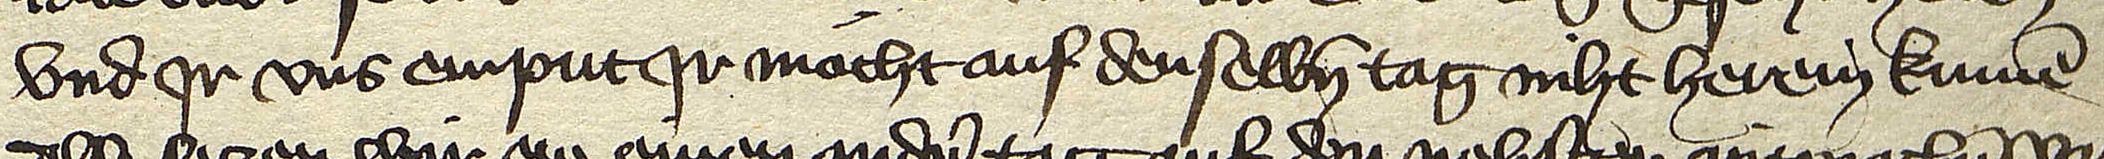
vnd Ir vns emput Ir möcht auf denſelbn* tag niht herein kume*
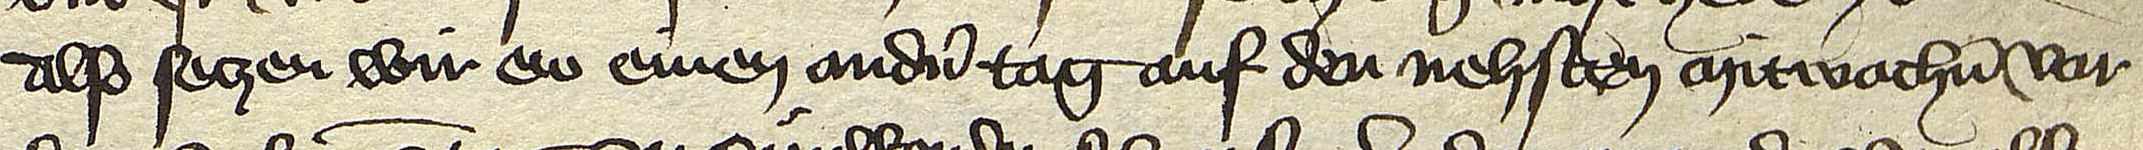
Alſo ſecʒen wir ew einen andn* tag auf den nehſten Mitwochn* vor
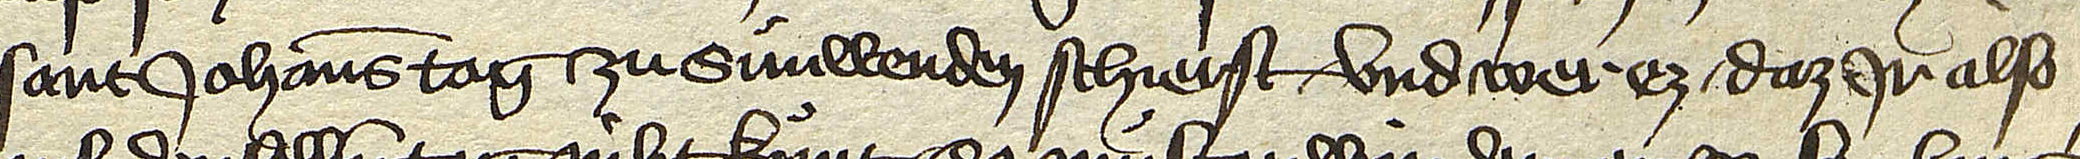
ſant Iohans* tag cʒu Sünwenden ſchierſt / vnd wer eʒ / daʒ Ir alſo
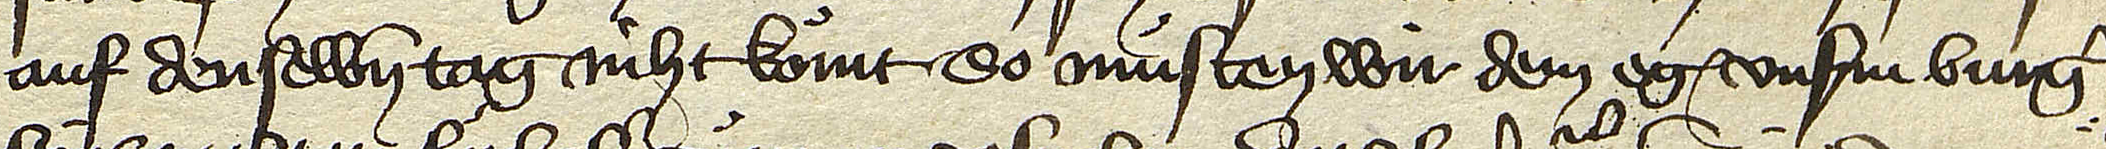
auf denſelbn* tag niht kömt / So müſten wir dem eg* vnſ*m burg*
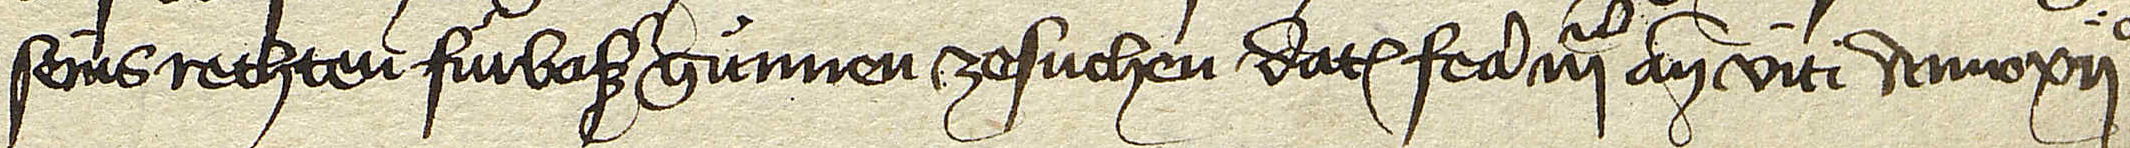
ſeins rechten fürbaſʒ günnen cʒeſuchen / dat* fea* iii* an* viti Anno xii*
